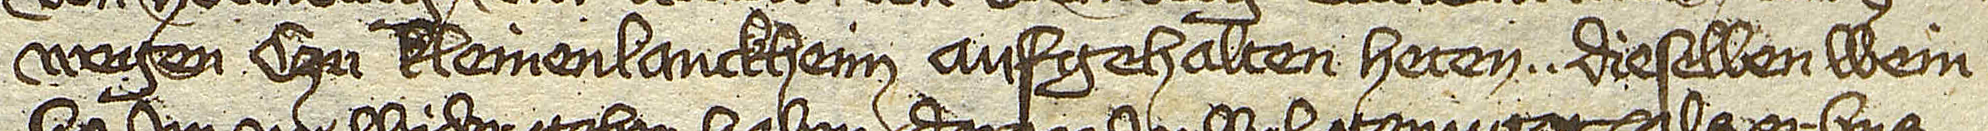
wegen Cʒu kleinenlanckheim aufgehalten heten ~ dieſelben wein
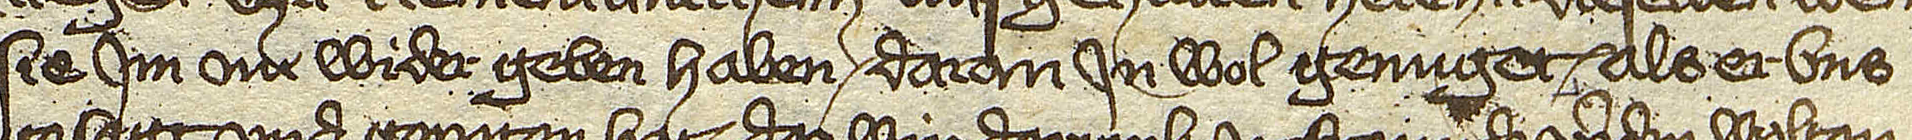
ſie Im nu wider geben haben / daran In wol genuget / als er vns
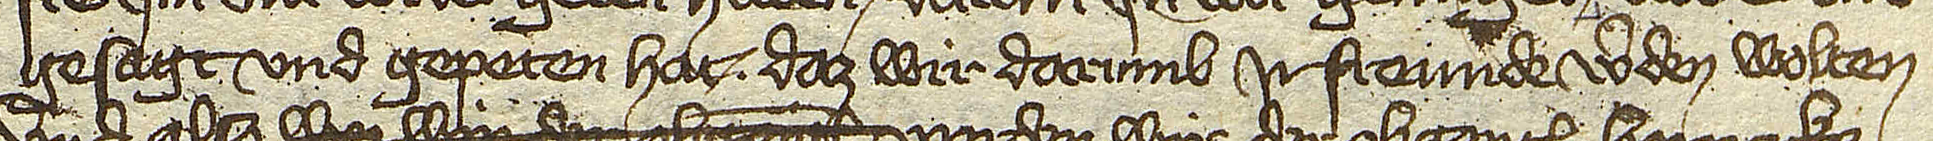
geſagt vnd gepeten hat / . daʒ wir darumb Ir freunde w*den wolten
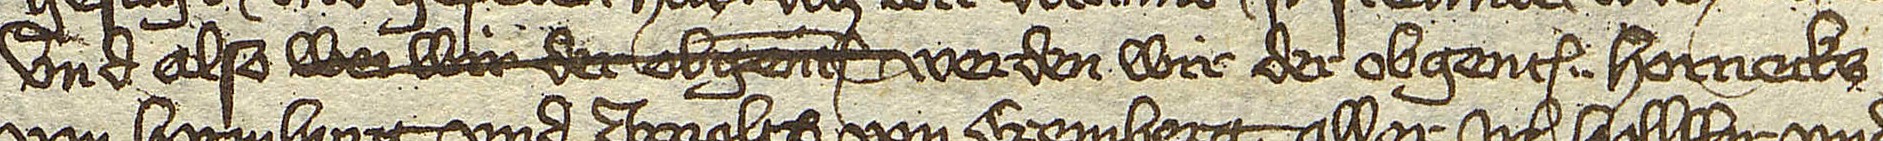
vnd alſo wer wir der obgent* werden wir der obgent* ~ hornecks
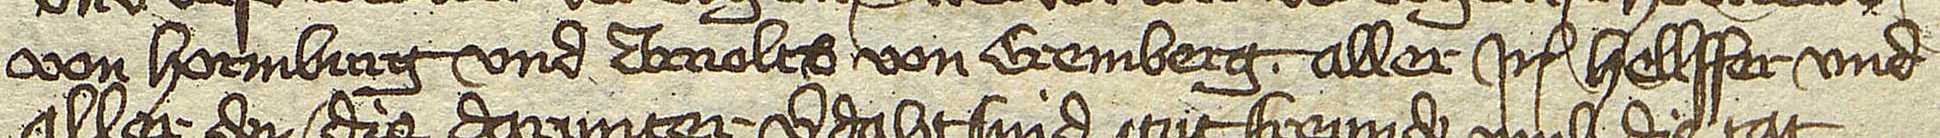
von hormburg vnd Arnolts von Gremberg. aller Ir* helffer vnd
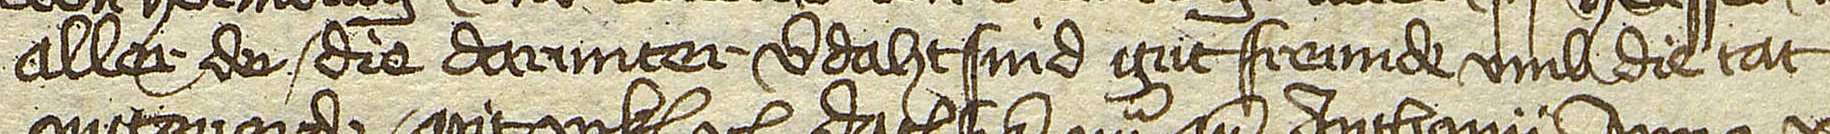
aller der / die darunter v*daht ſind gut freunde vnd die tat
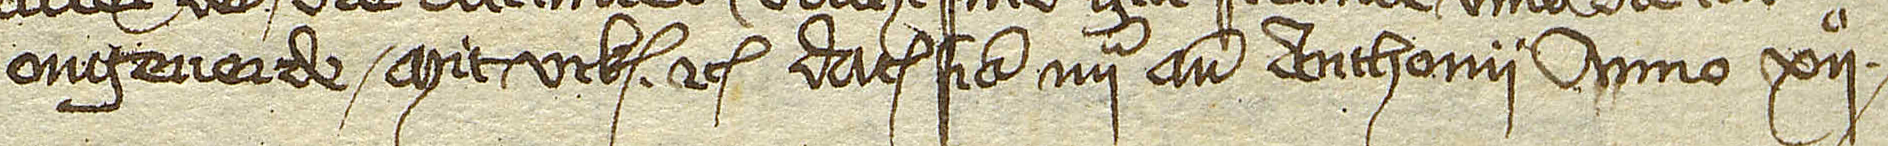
ongeuerde / Mit vrk*. ec* dat* fia* iiii* an* Anthonii* Anno xii* . /
